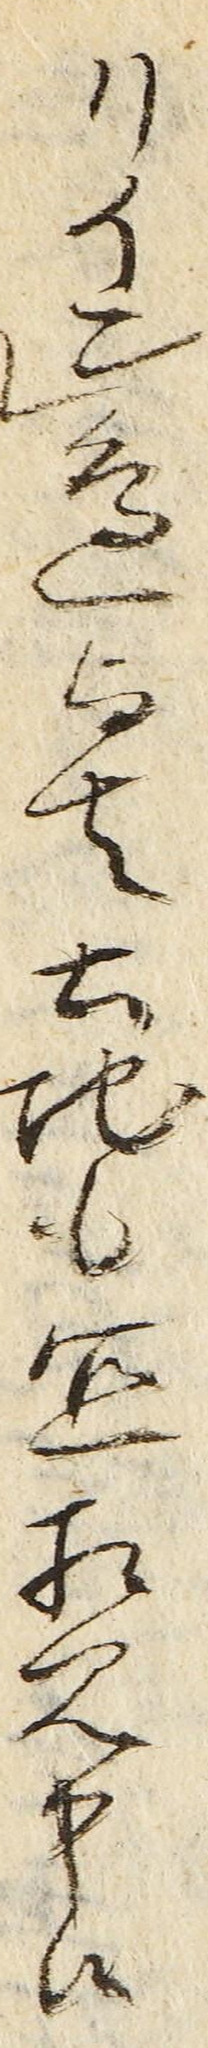リイン」辺とは土地も宜相見申候
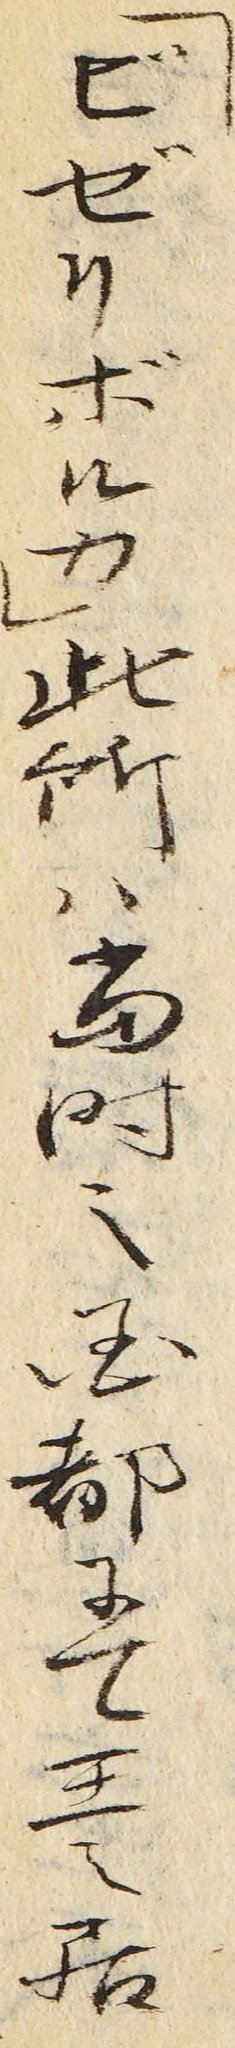「ビゼリボルカ」此所は当時之国都にて王之居

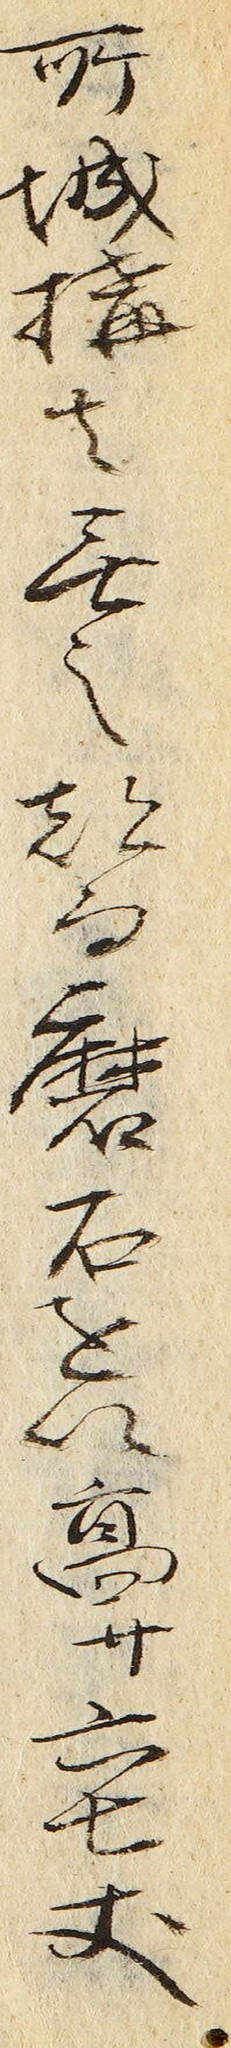所城構は無之都て磨石を以高サ六七丈
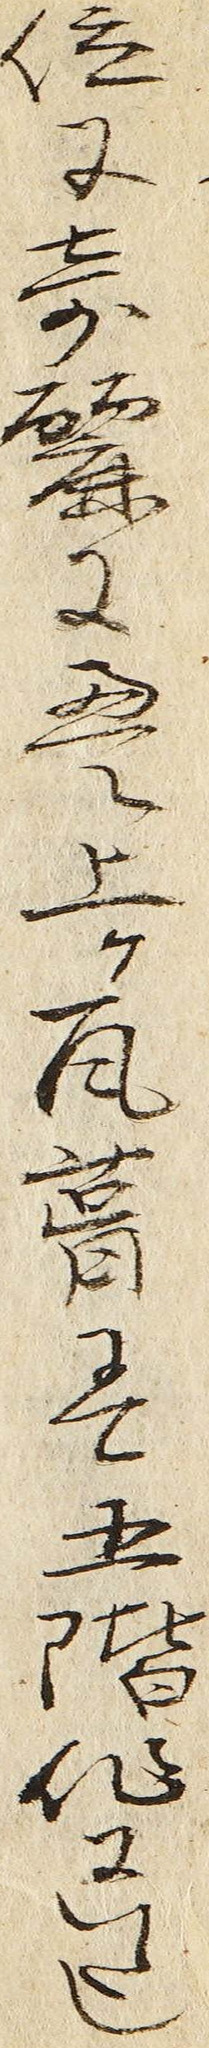位に奇麗に畳上ヶ瓦葺にて五階作にいたし
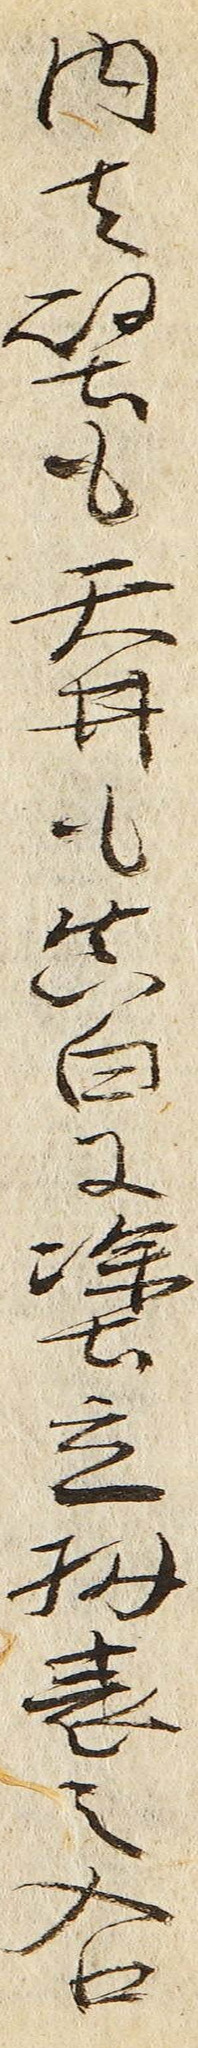内は壁も天井も真白に塗立扨表之入口
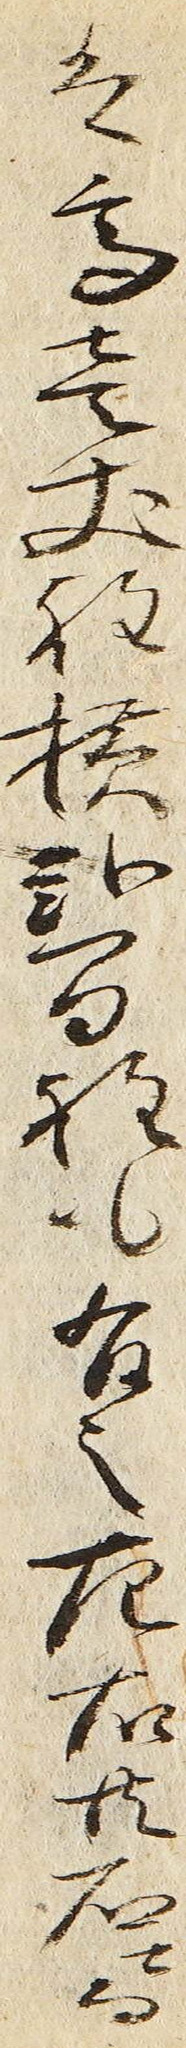は高壱丈程横弐間程も有之左右共石にて
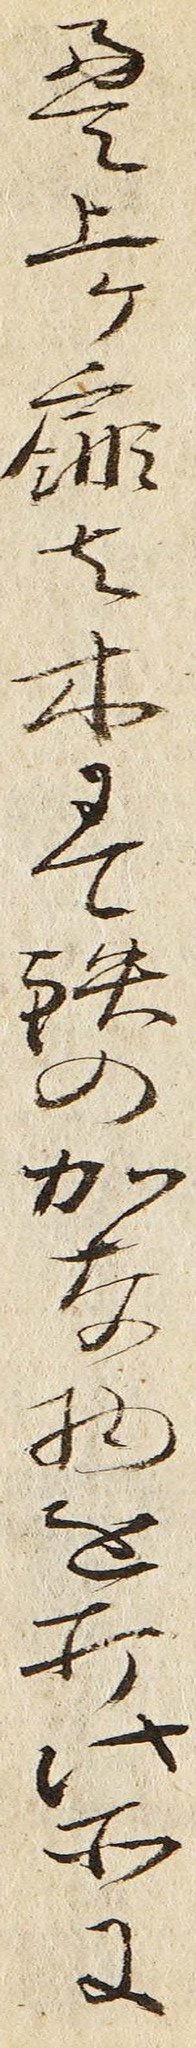畳上ヶ扉は木にて鉄のかな物を打此所に
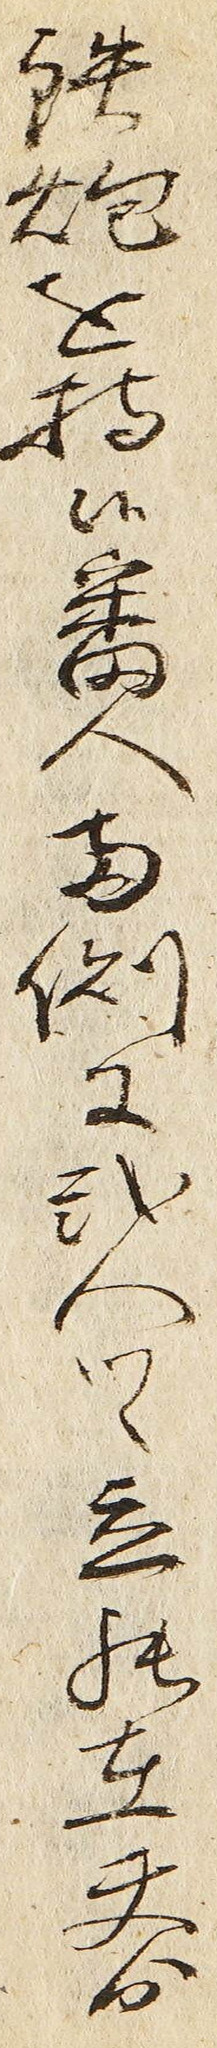鉄炮を持候番人両側に弐人ツヽ立罷在夫ゟ
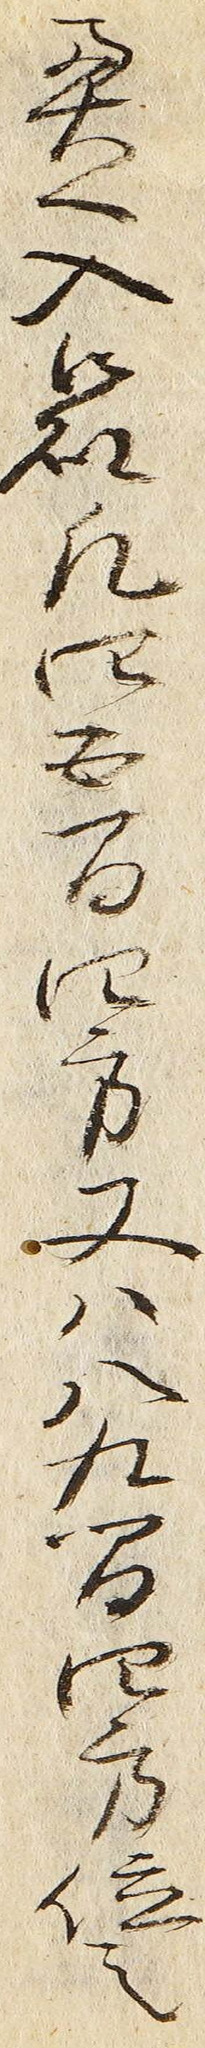奥へ入候処凡四五間四方又は八九間四方位之
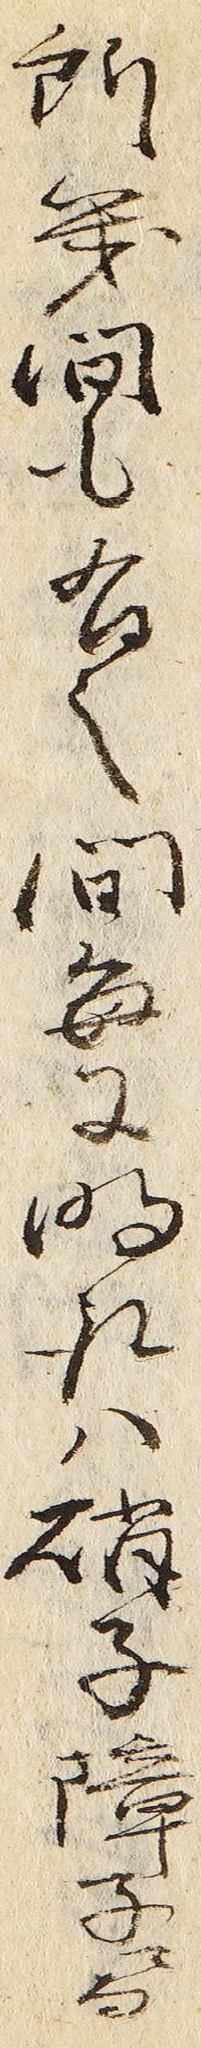所幾間も有之間毎に明取は硝子障子にて
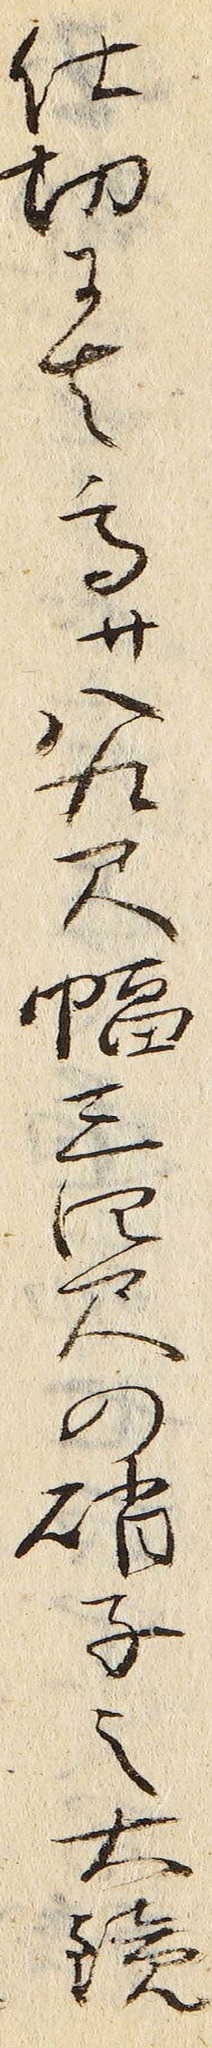仕切には高サ八九尺幅三四尺の硝子之大鏡
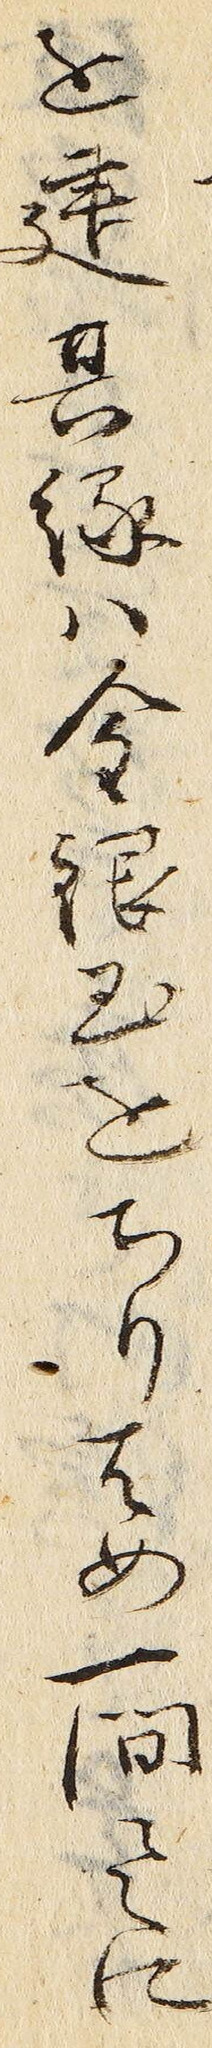を建其縁は金銀玉をちりはめ一間々々に
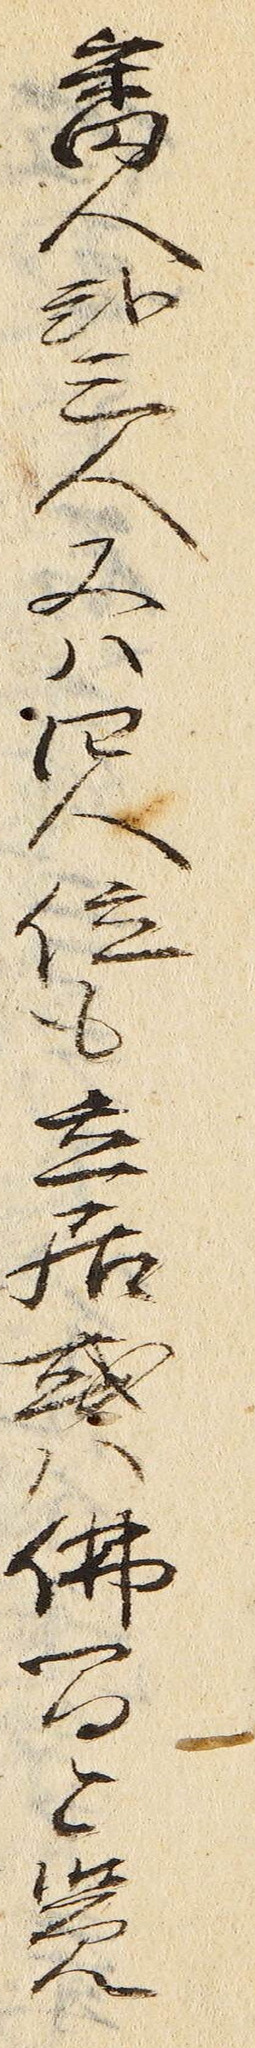番人弐三人又は四人位も立居或は仏間と覚
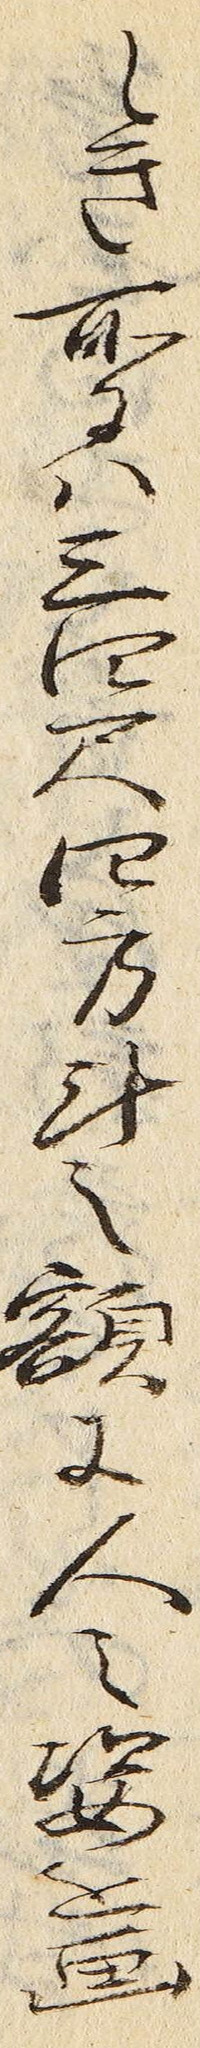しき所には三四尺四方斗之額に人之姿を画
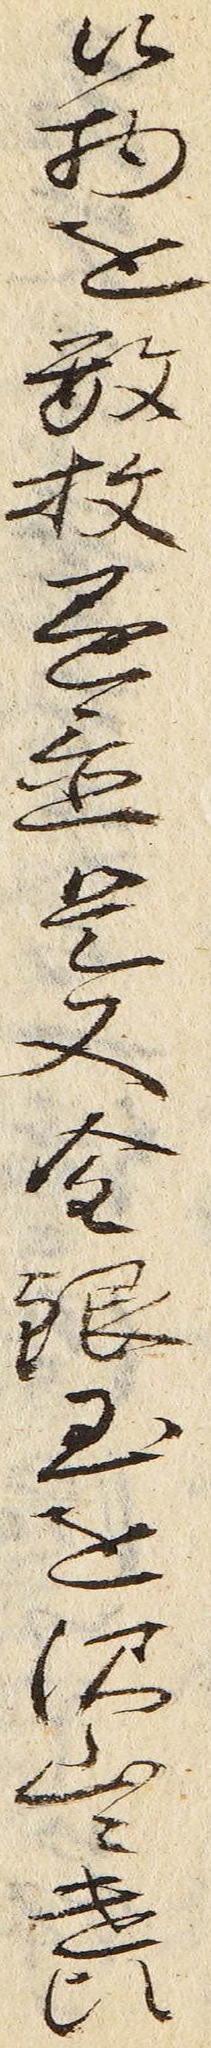候物を数枚懸置是又金銀玉を沢山に遣ひ
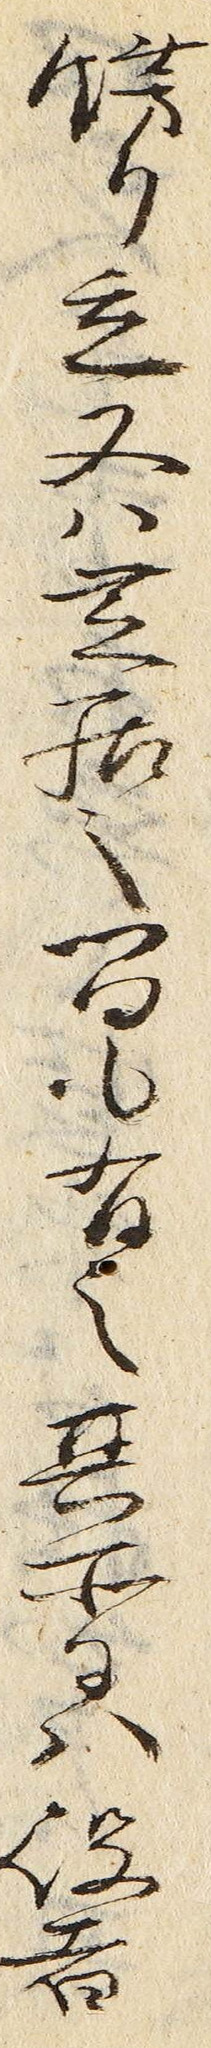餝り立又は芝居之間も有之其所には役者
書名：漂民後記
